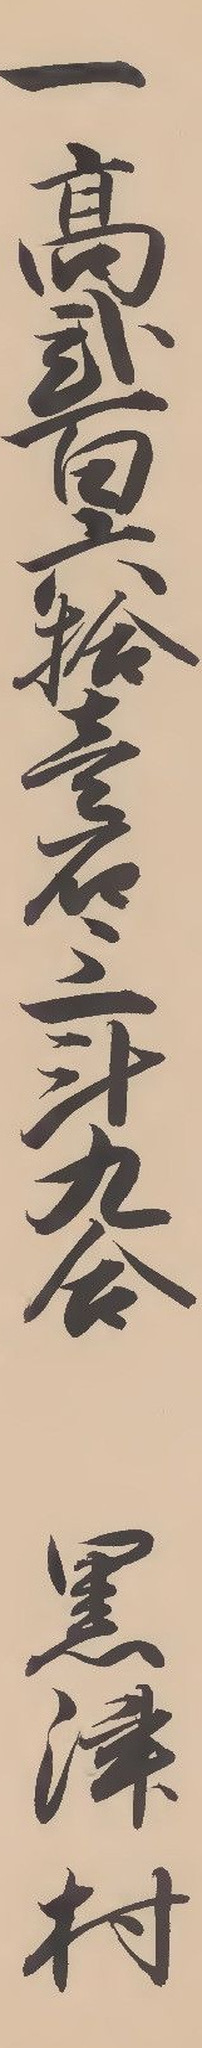一高弐百六拾壱石三斗九合黒津村
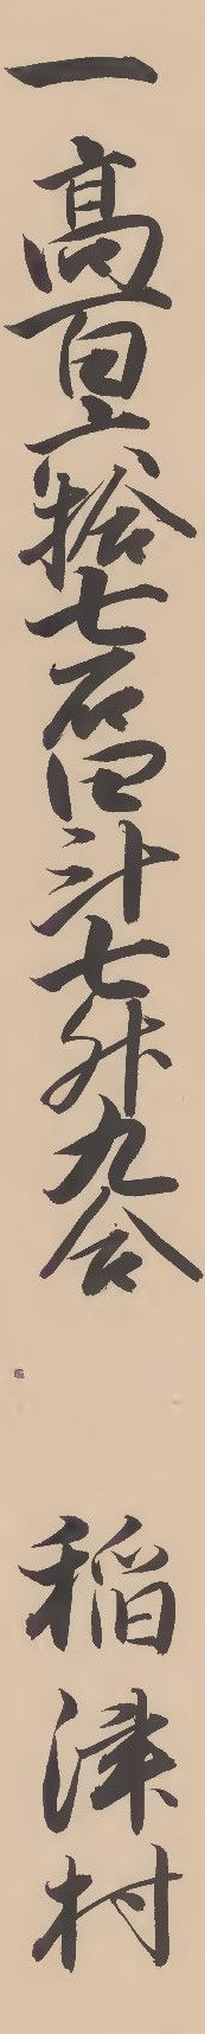一高百六拾七石四斗七升九合稲津村

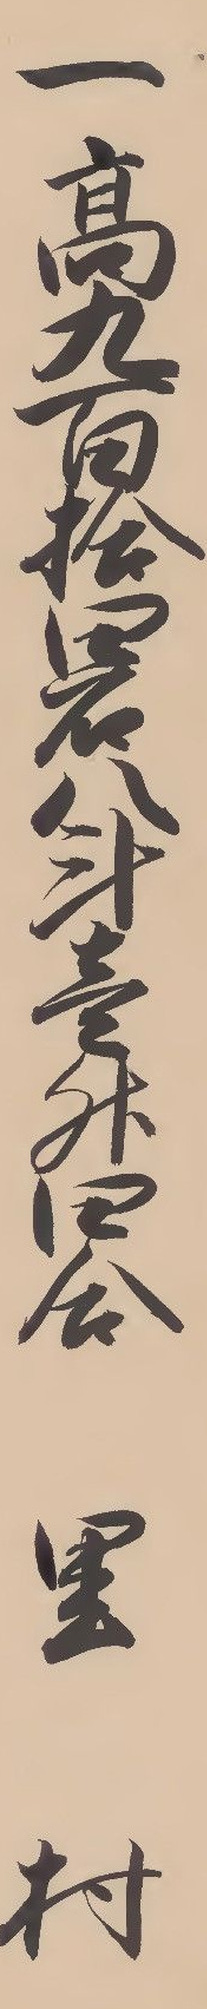一高九百拾四石八斗壱升四合里村
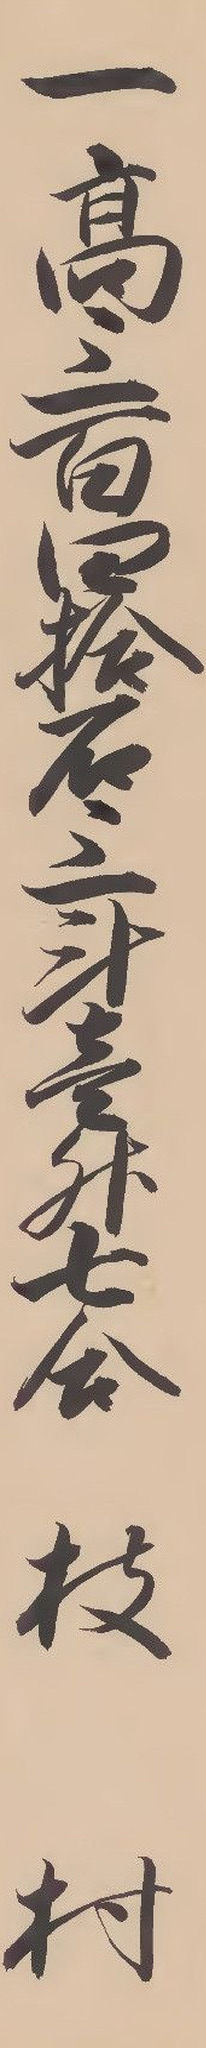一高三百四拾石三斗壱升七合枝村
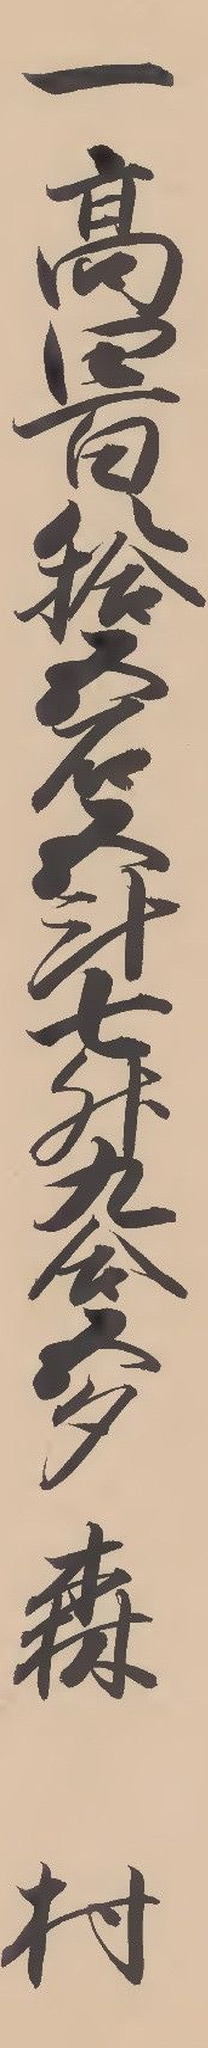一高四百八拾五石五斗七升九合五勺森村
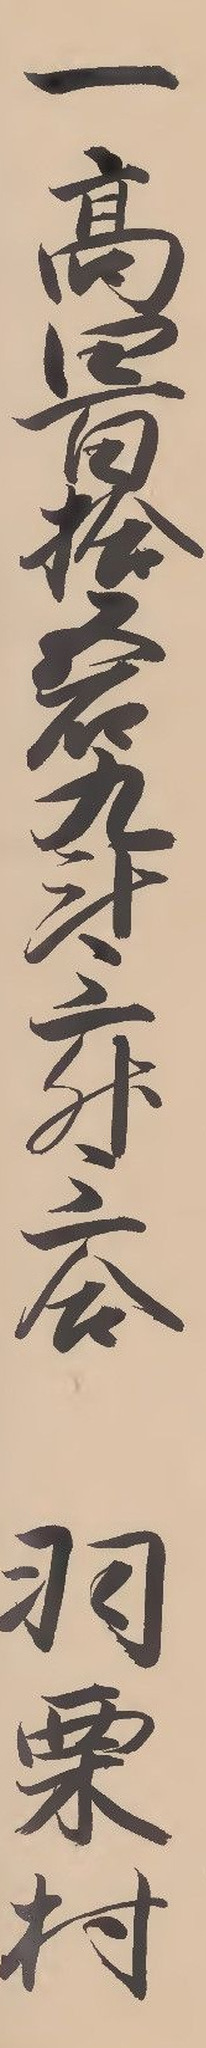一高四百拾五石九斗三升三合羽栗村
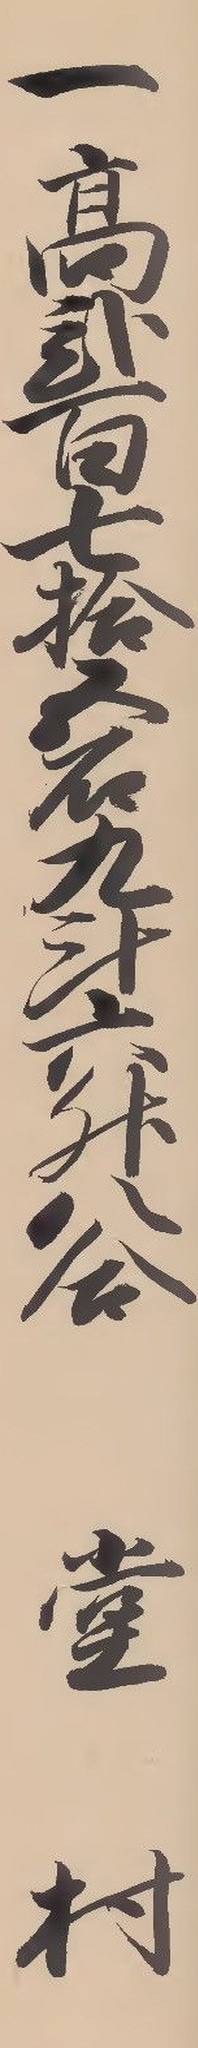一高弐百七拾五石九斗六升八合堂村
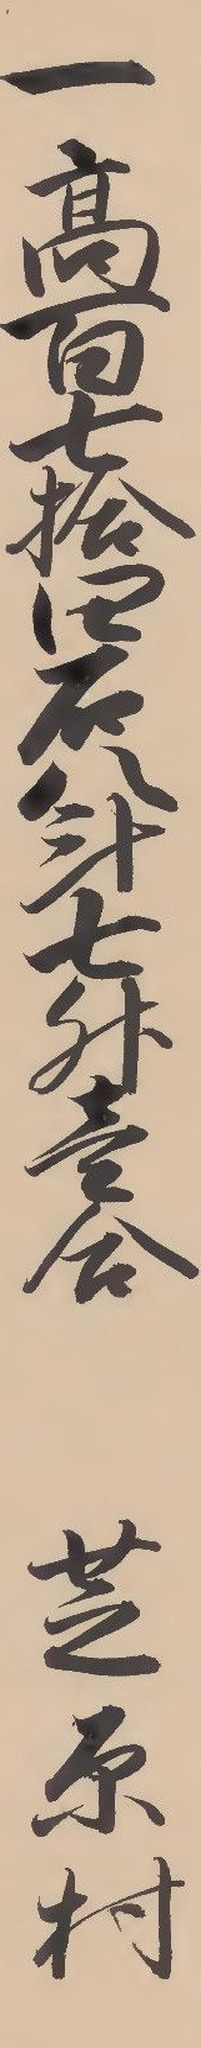一高百七拾四石八斗七升壱合芝原村
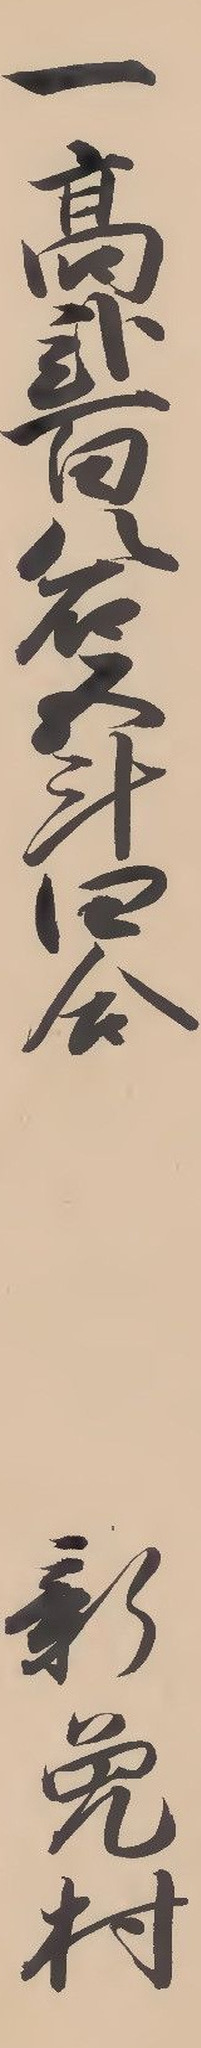一高弐百八石五斗四合新免村
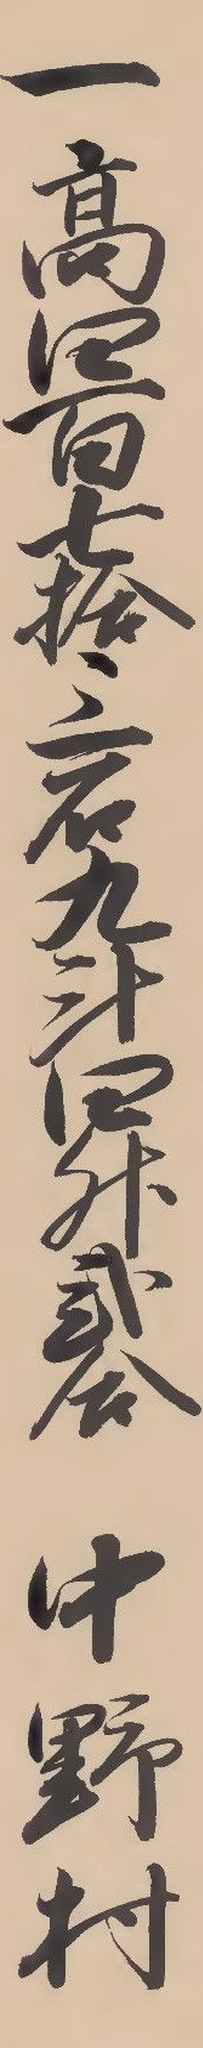一高四百七拾三石九斗四升弐合中野村

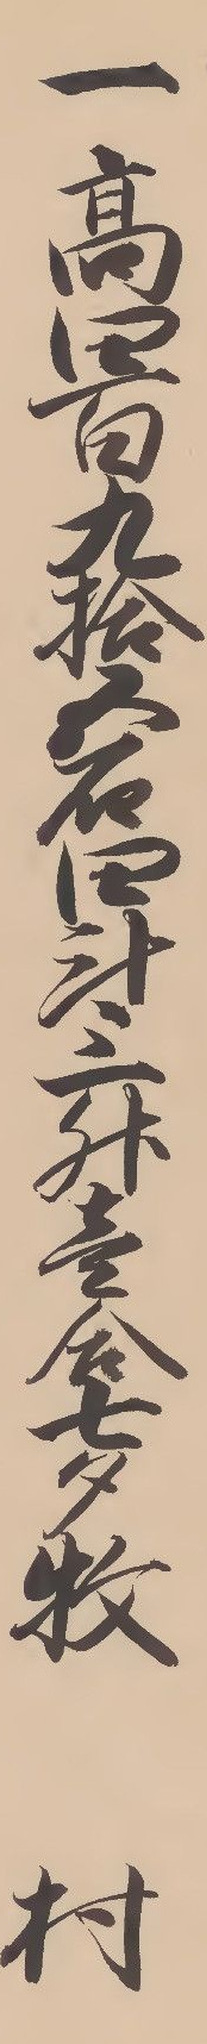一高四百九拾五石四斗三升壱合七勺牧村
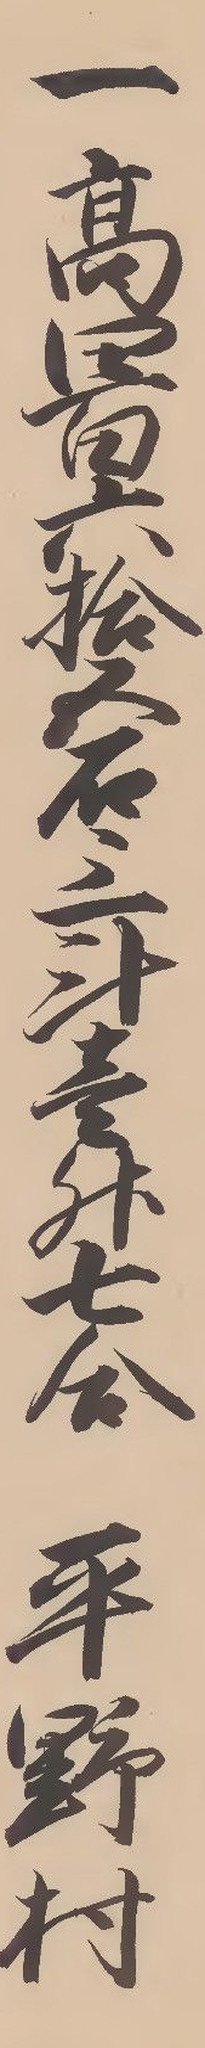一高四百六拾五石三斗壱升七合平野村
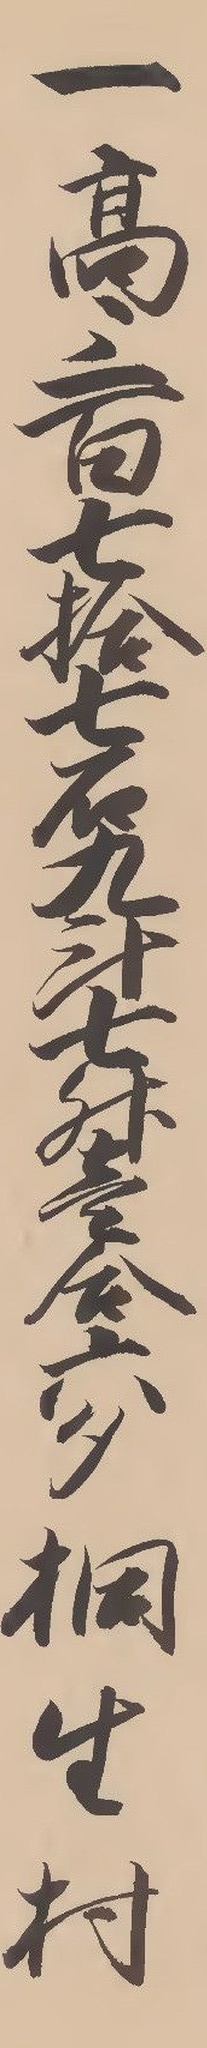一高三百七拾七石九斗七升壱合六勺桐生村
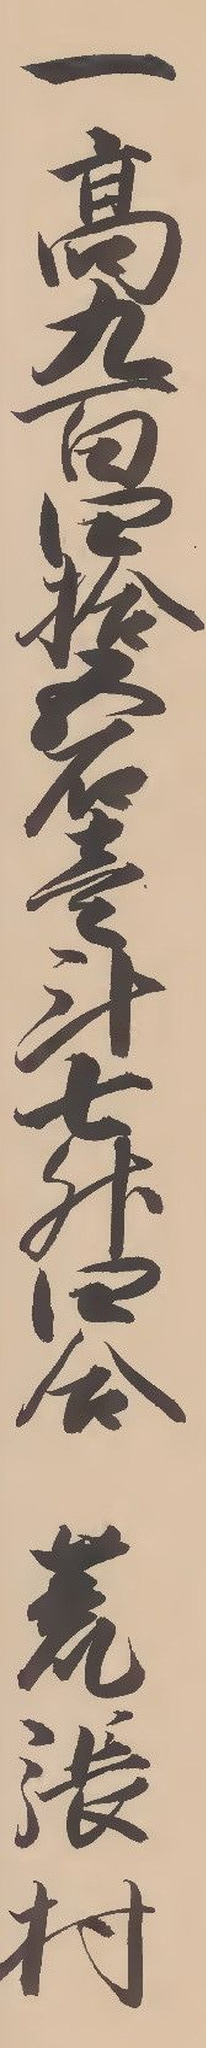一高九百四拾五石壱斗七升四合荒張村
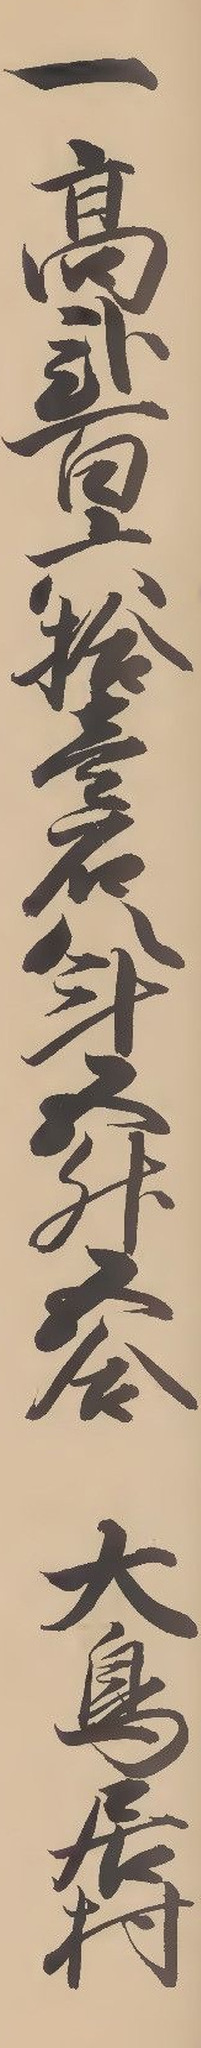一高弐百六拾壱石八斗五升五合大鳥居村
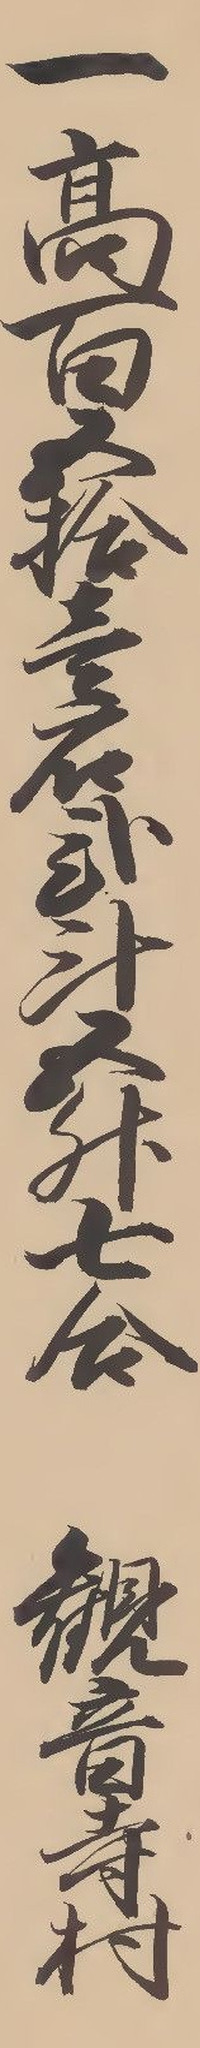一高百五拾壱石弐斗五升七合観音寺村
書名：近江国郷帳
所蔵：国立公文書館 National Archives of Japan
